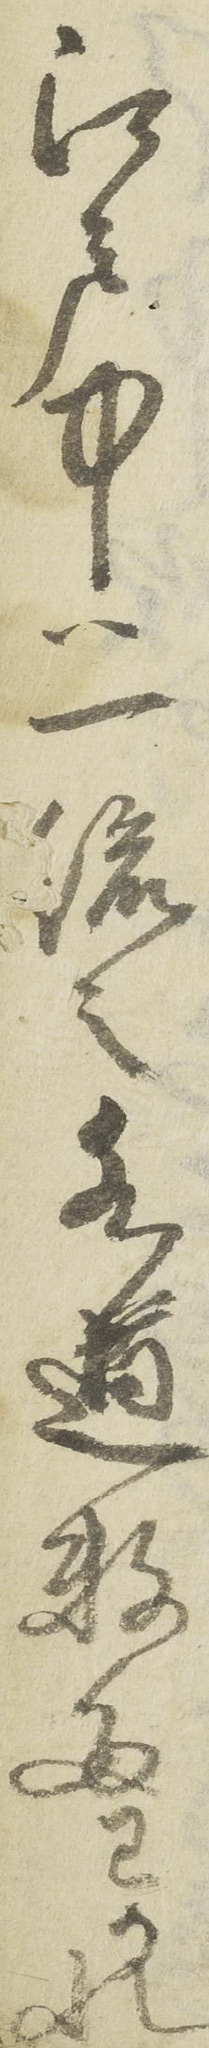江戸中は一統之水道数多わかれ

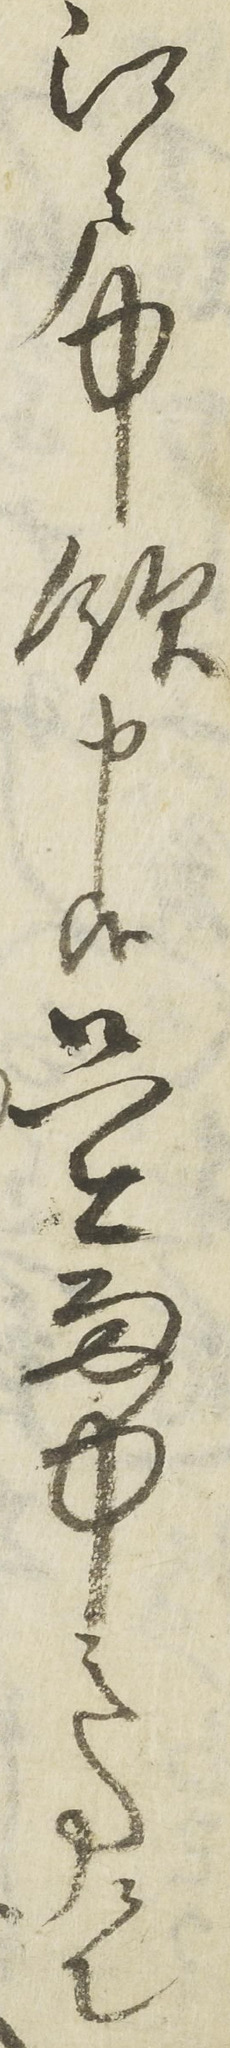江戸中飲申候只今ま中之事ニて
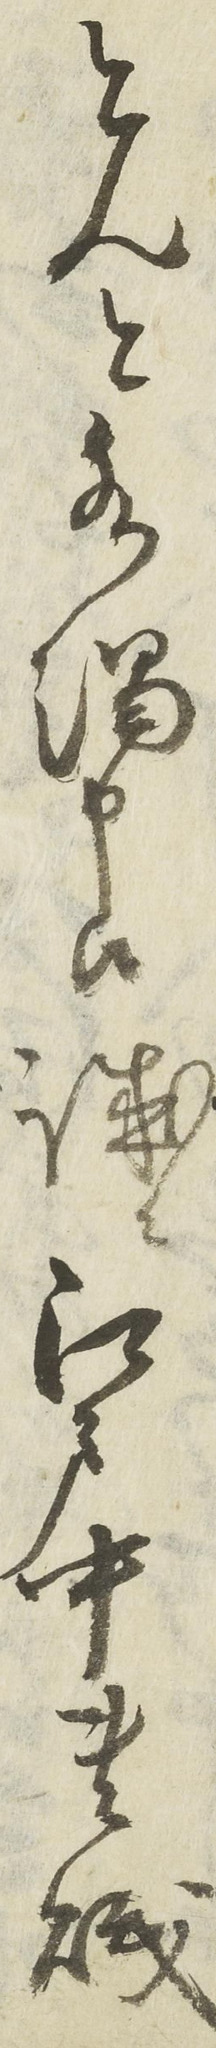とんと水渇申候殊ニ江戸中貴賤
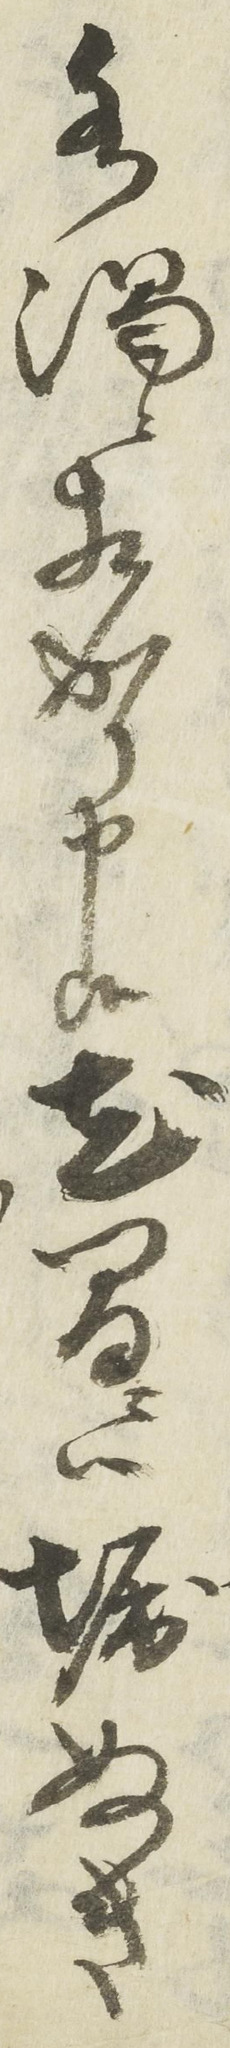水渇ニ相成申候尤間ニは堀ぬき
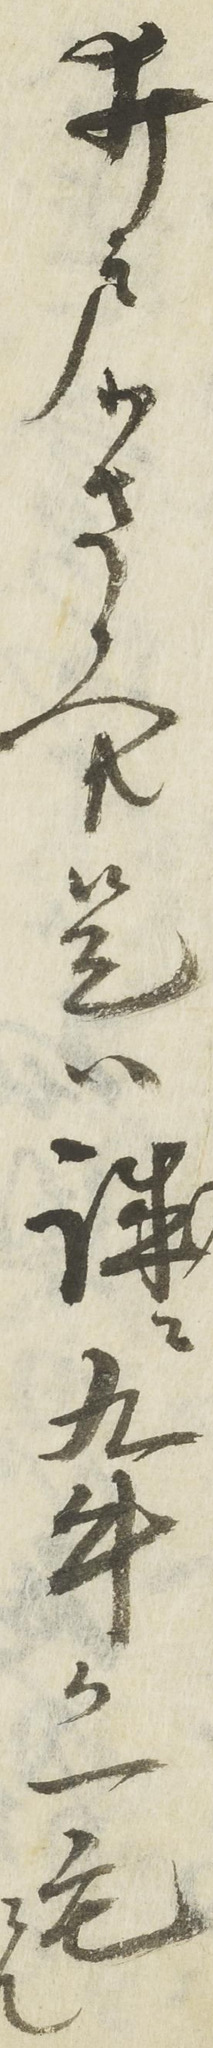井戸小さ候へ共是は殊ニ九牛か一毛ニて
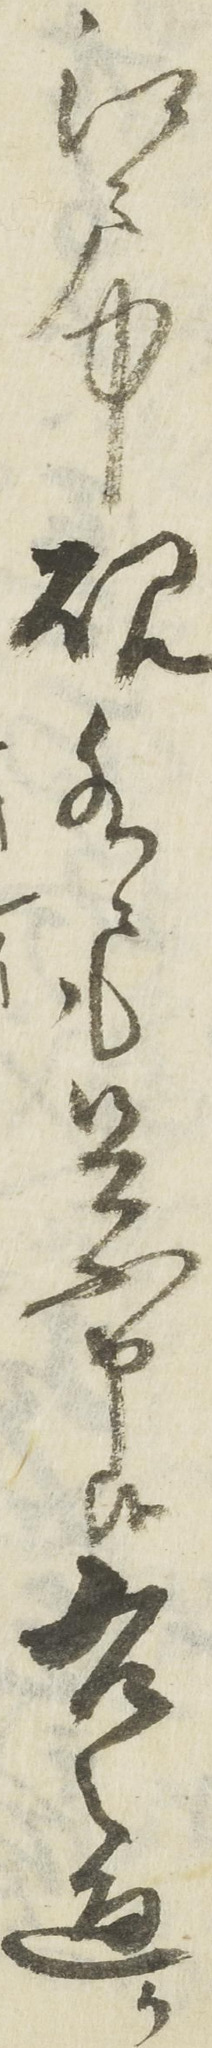江戸中硯水ニも呉不申候右之通り
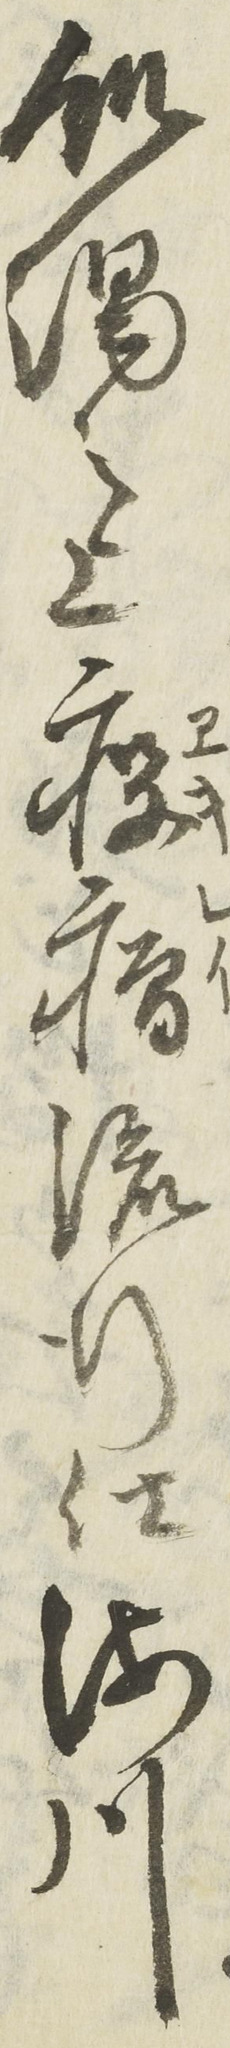飢渇之上疫癘流行仕海川
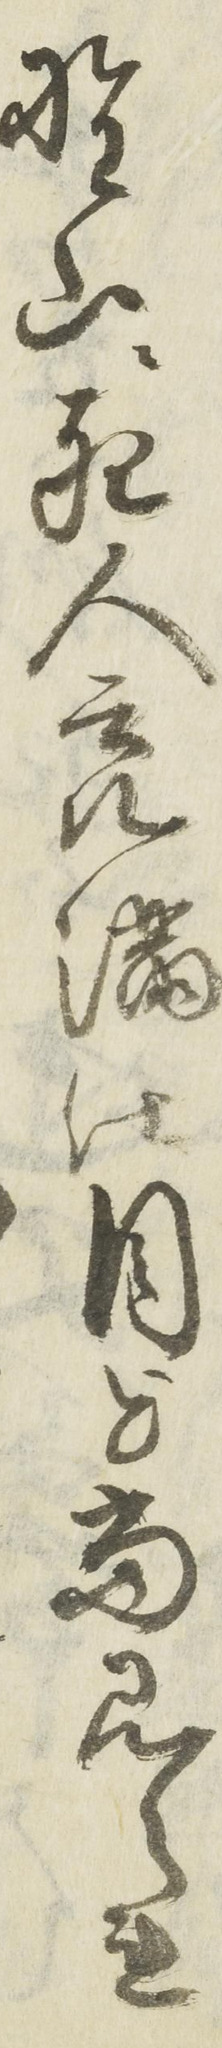野山ニ死人充満仕目を当見られ
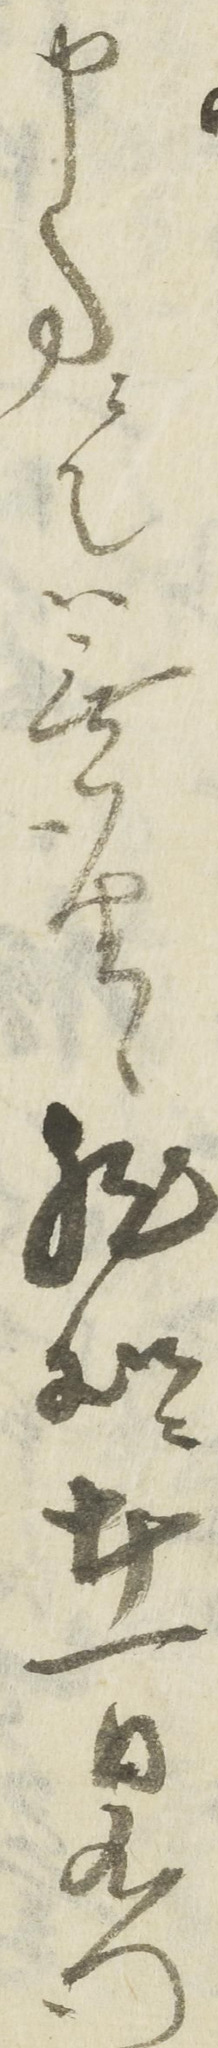申事ニては無御坐候然処ニ廿一日九つ
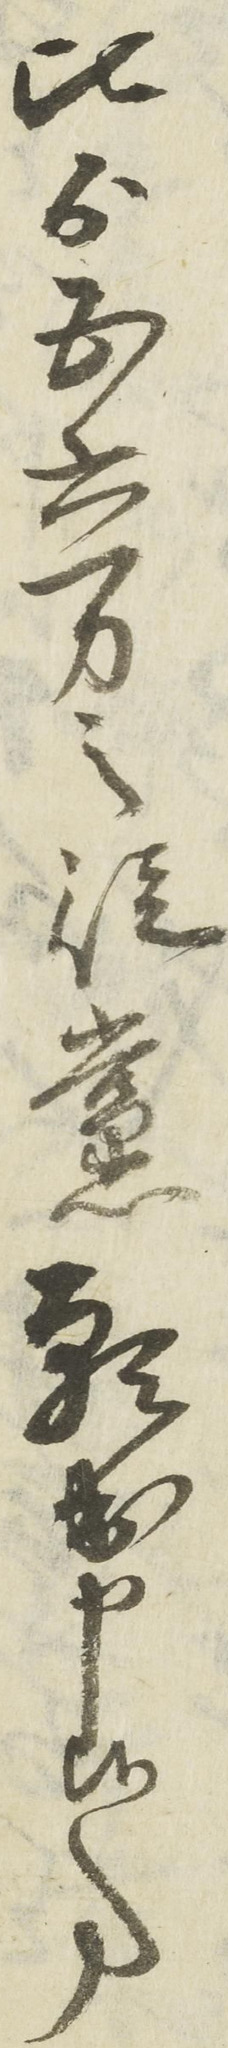比ゟ五六万之徒党願出申候事
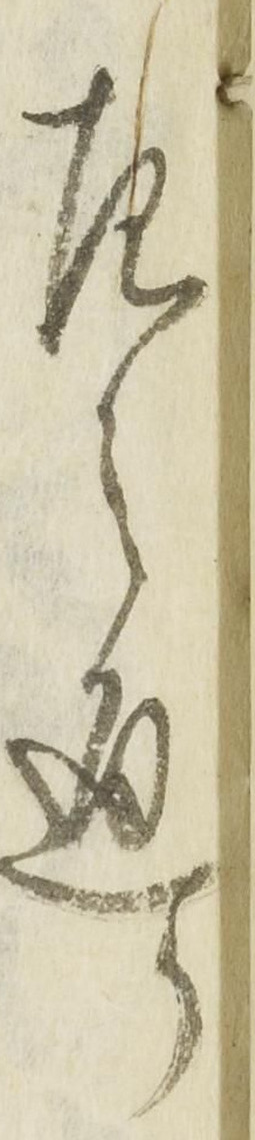左之通り
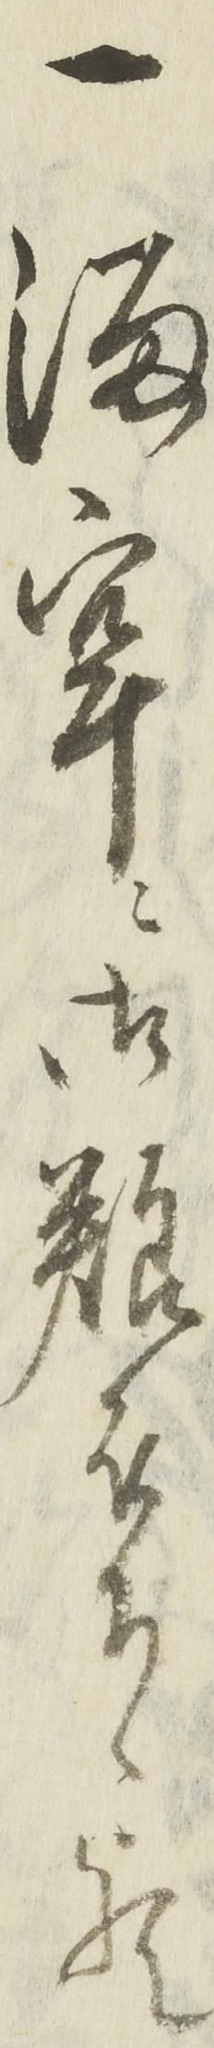一溜牢ニ御養被下候歟
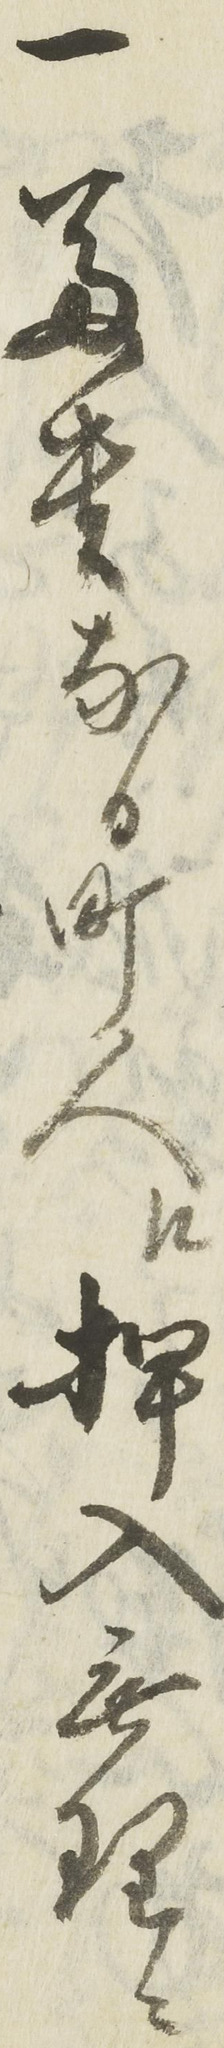一富貴なる町人え押入無理ニ
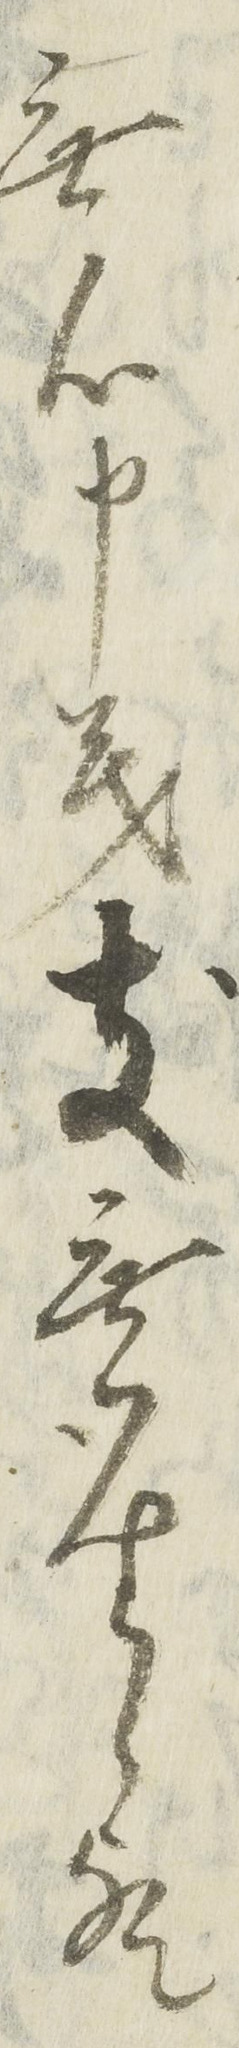無心申義支無御坐候歟
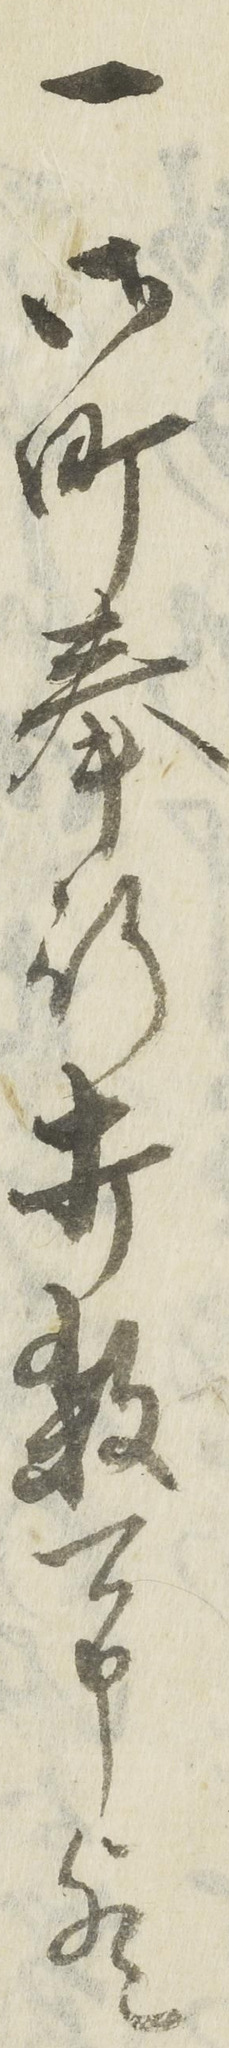一御町奉行打殺可申歟
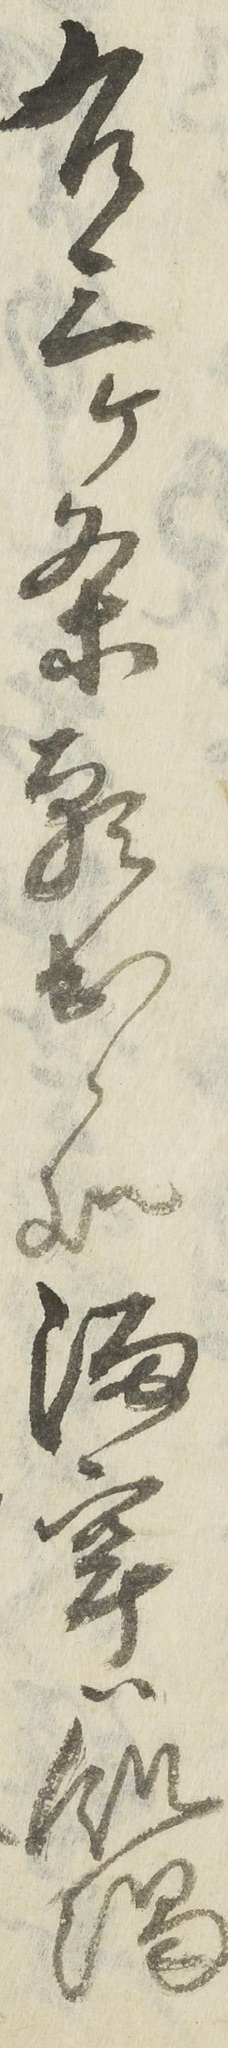右三ヶ条願出候処溜牢は飢渇
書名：後見笑
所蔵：東京大学地震研究所図書室 Earthquake Research Institute Library, The University of Tokyo, JAPAN
